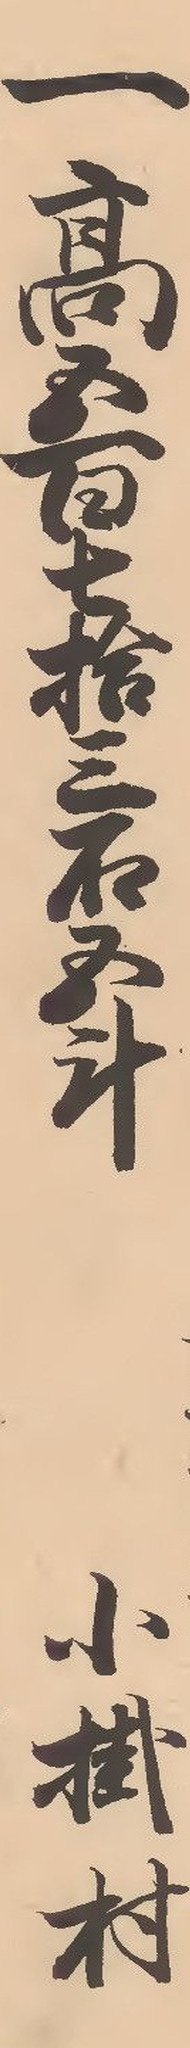一高五百七拾三石五斗小掛村

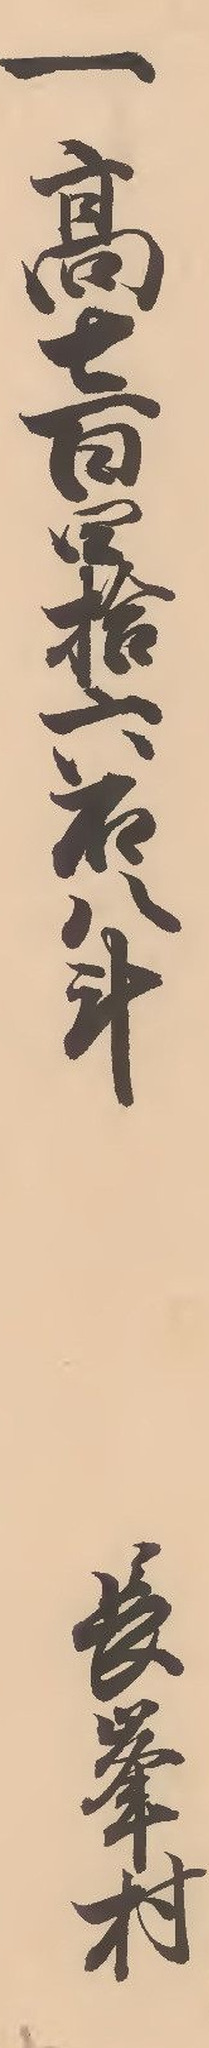一高七百四拾六石八斗長峯村
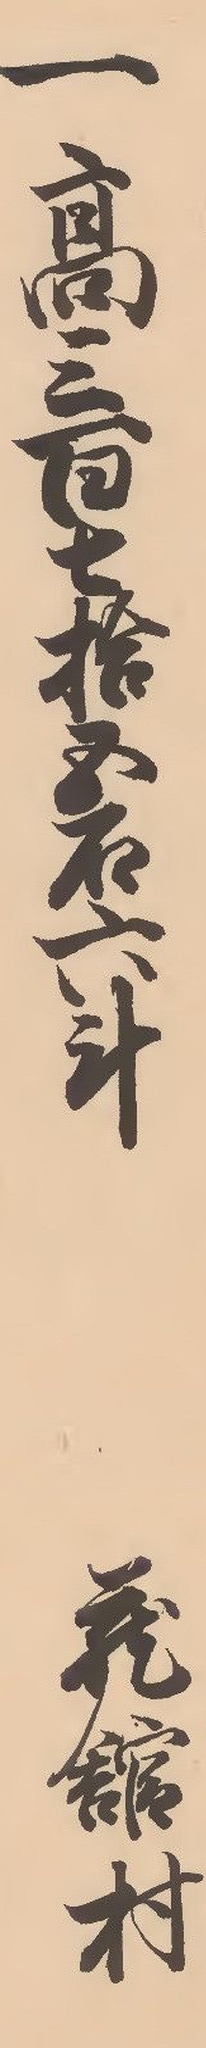一高三百七拾五石六斗蔵館村
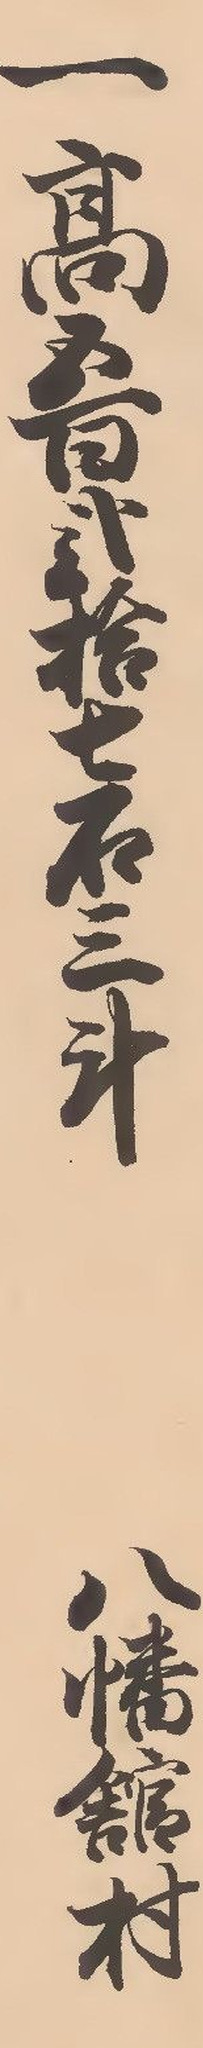一高五百弐拾七石三斗八幡館村
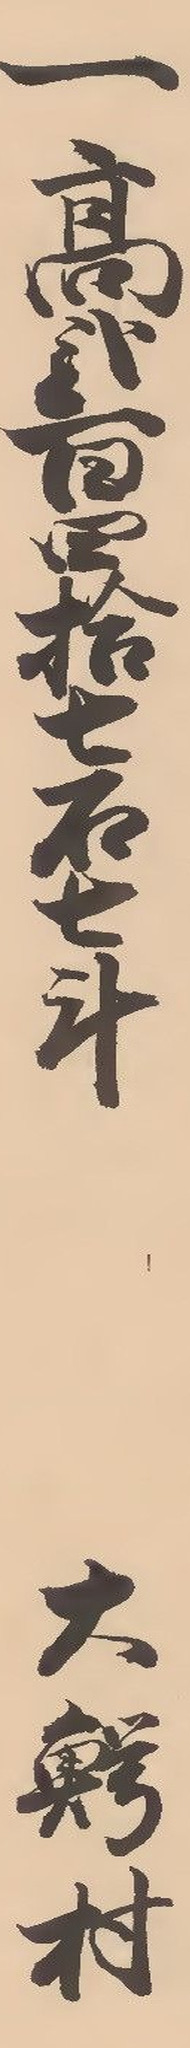一高弐百四拾七石七斗大鰐村
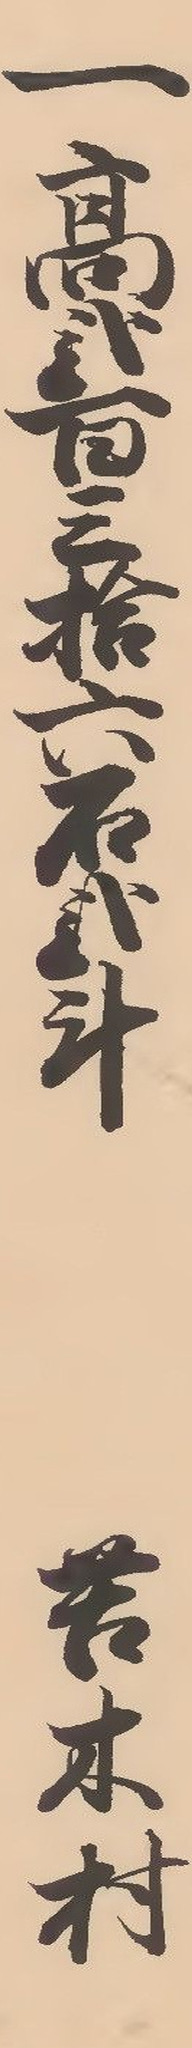一高弐百三拾六石弐斗苦木村
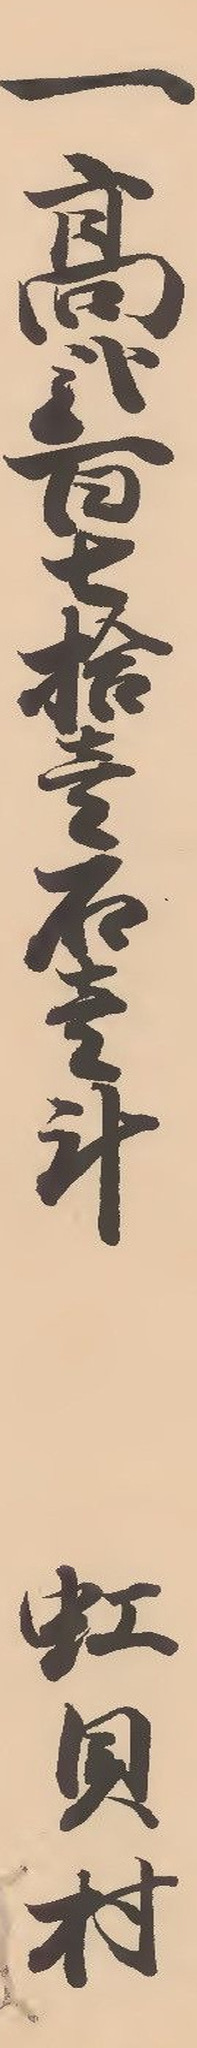一高弐百七拾壱石壱斗虹貝村

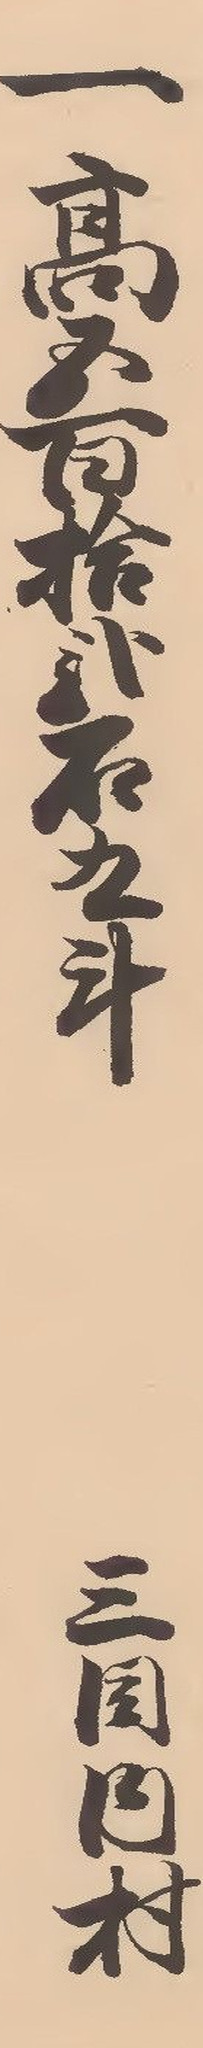一高五百拾弐石九斗三目内村
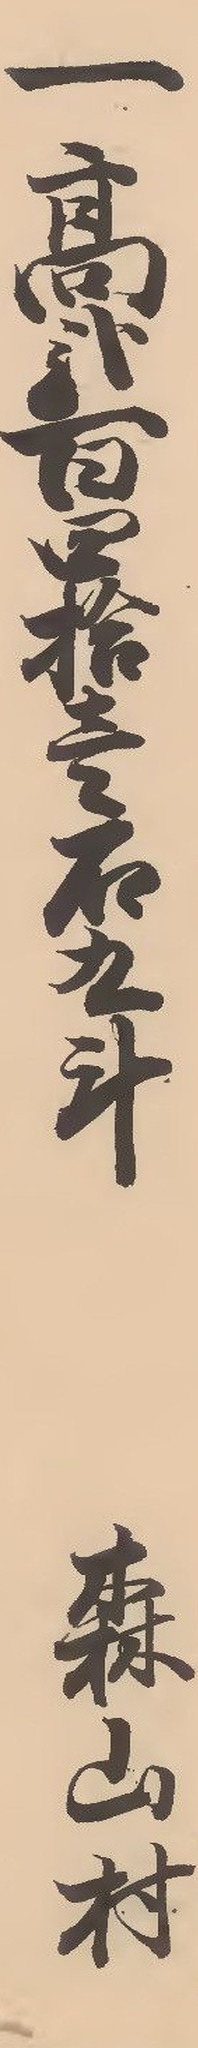一高弐百四拾壱石九斗森山村
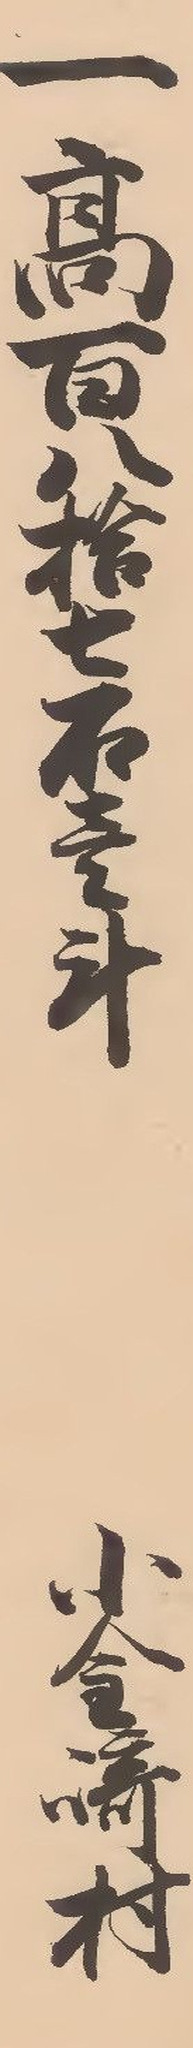一高百八拾七石壱斗小金崎村
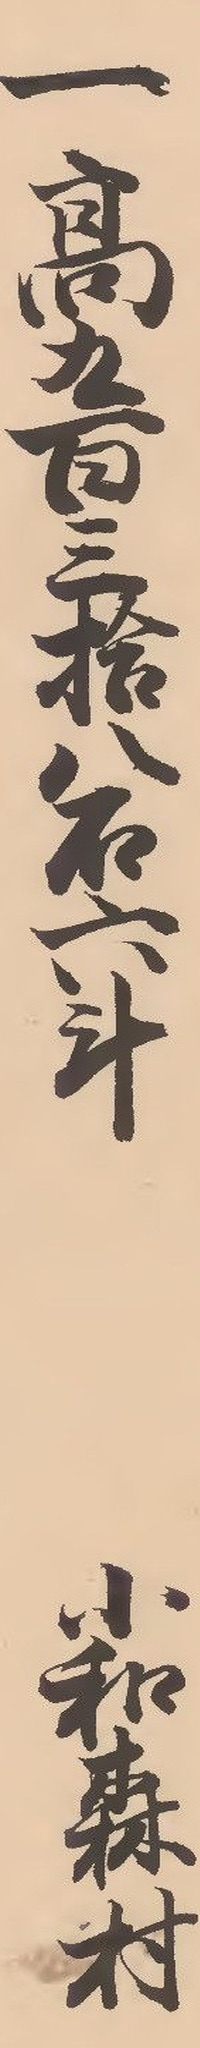一高九百三拾八石六斗小和森村
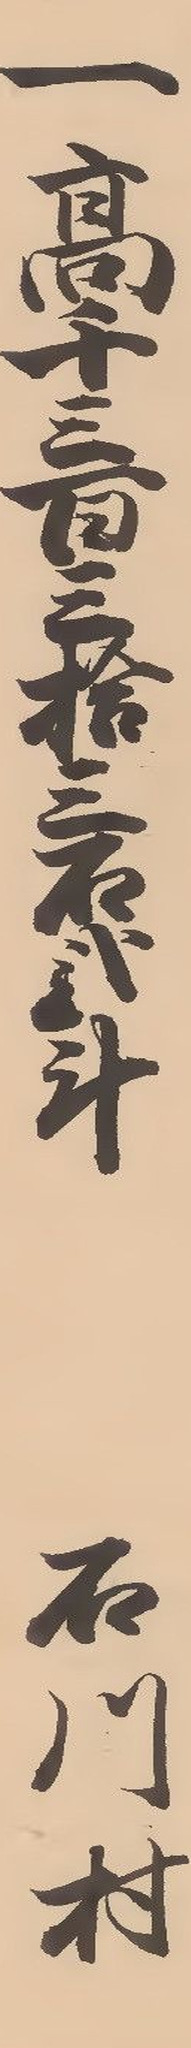一高千三百三拾三石弐斗石川村
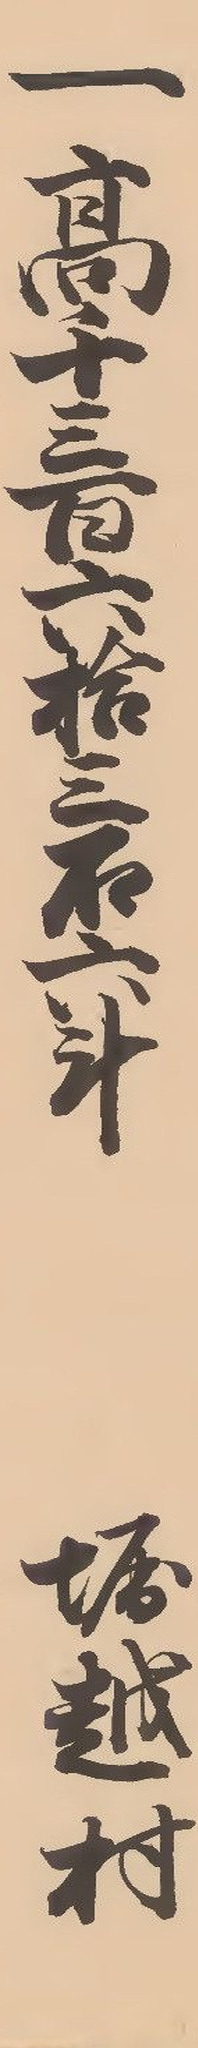一高千三百六拾三石六斗堀越村
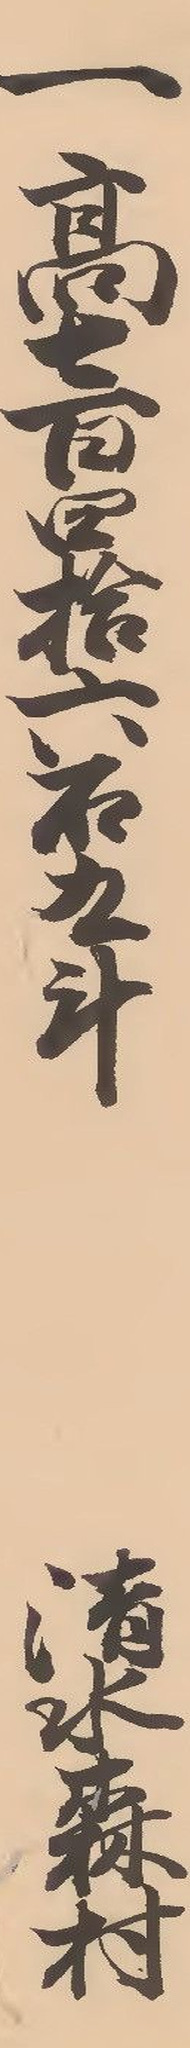一高七百四拾六石九斗清水森村
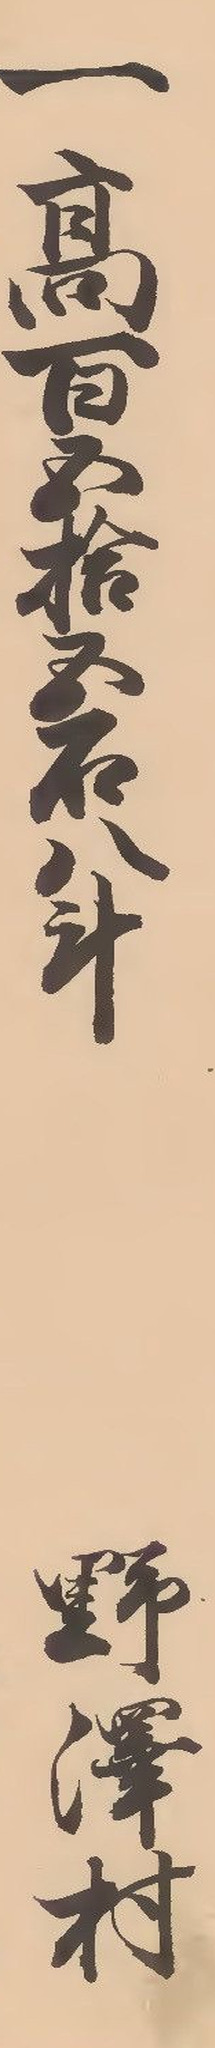一高百五拾五石八斗野沢村

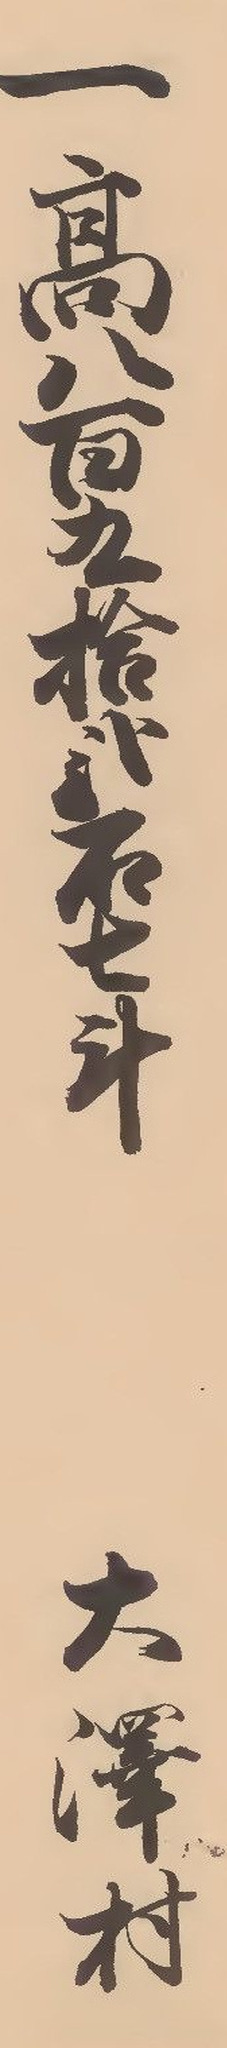一高八百九拾弐石七斗大沢村
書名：陸奥国郷帳　７
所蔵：国立公文書館 National Archives of Japan
